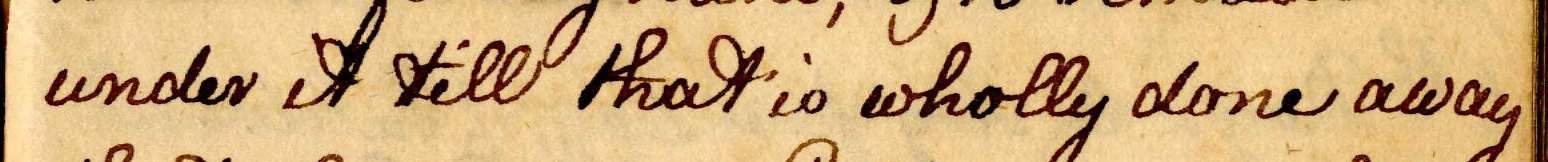under it till that is wholly done away
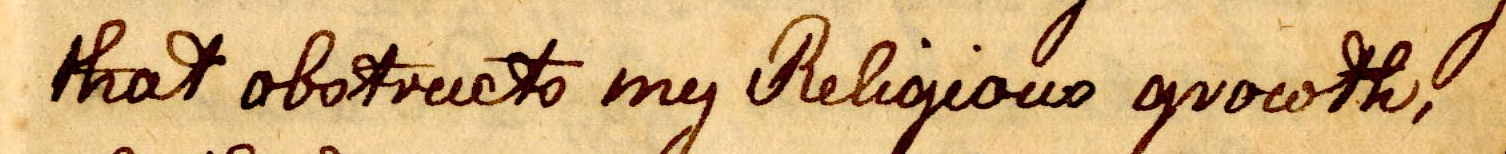that obstructs my Religious growth,
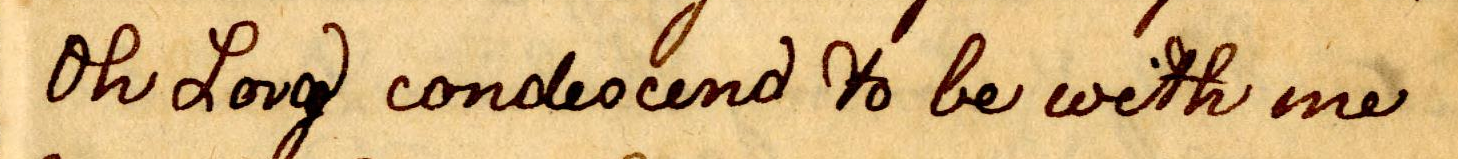Oh Lord condescend to be with me
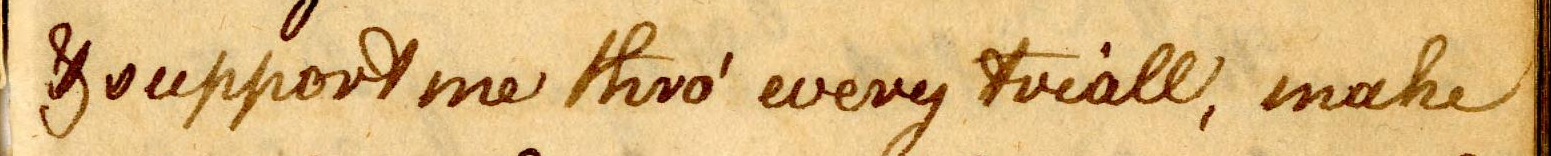& support me thro' every triall, make
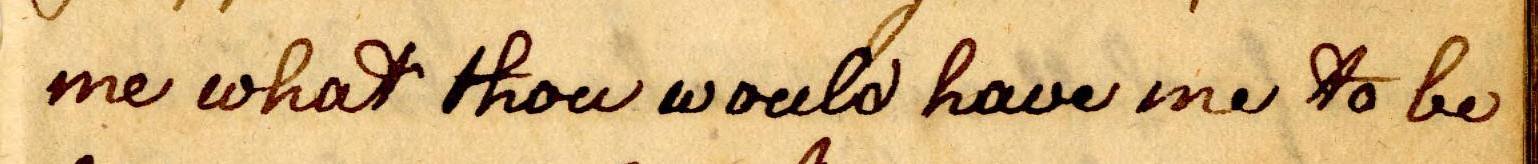me what thou would have me to be
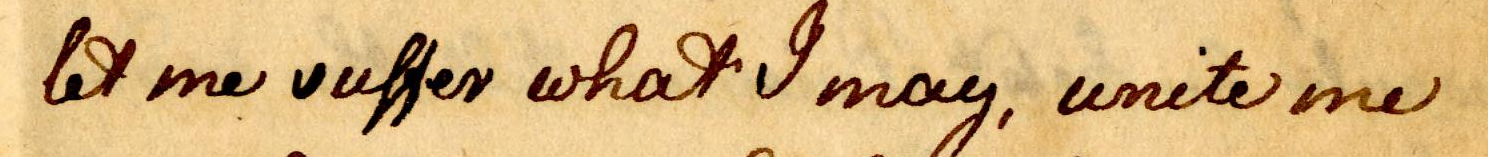let me suffer what I may, unite me
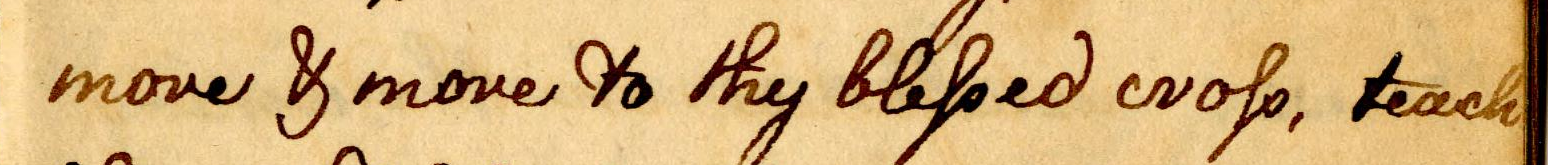more & more to thy blessed cross, teach
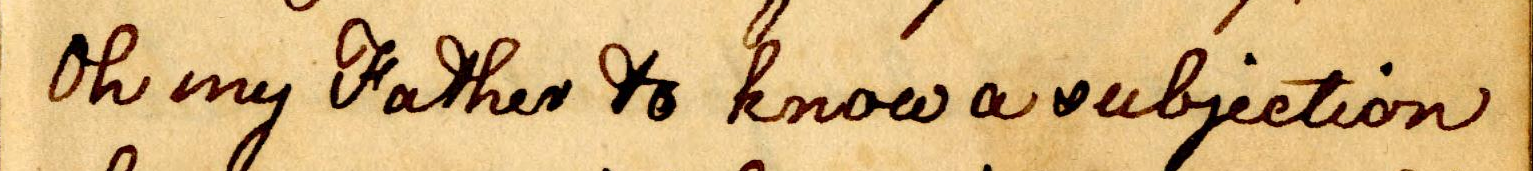Oh my Father to know a subjection
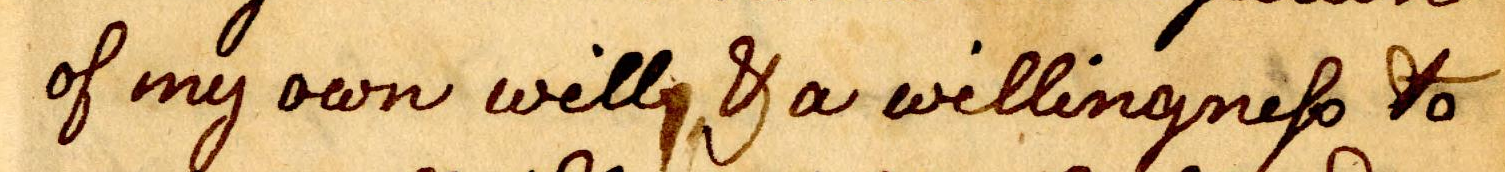of my own will, & a willingness to
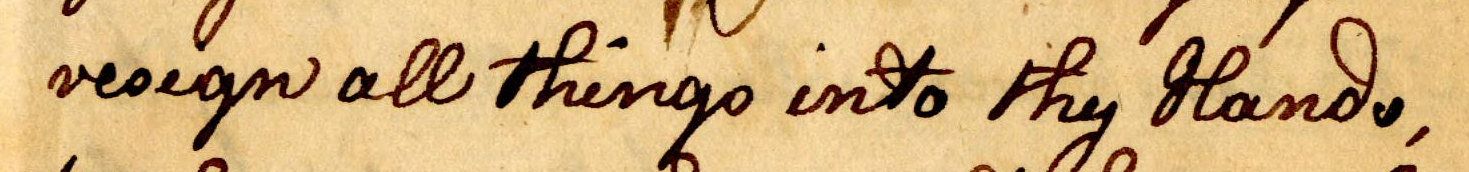resign all things into thy Hands,
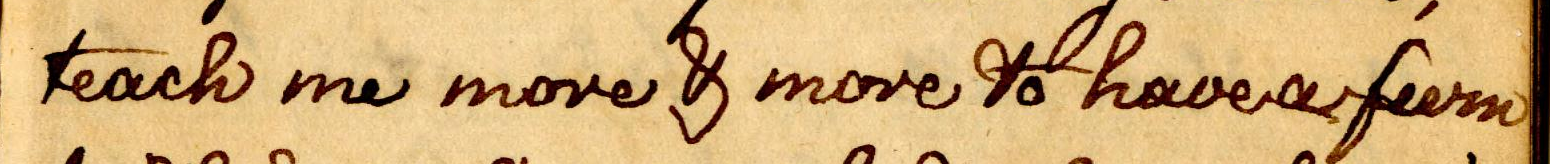teach me more & more to have a feerm
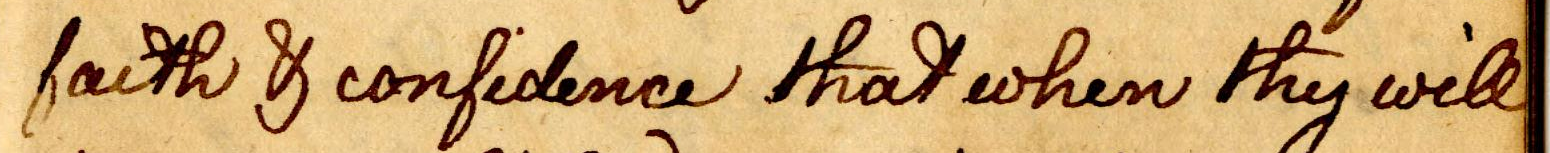faith & confidence that when thy will
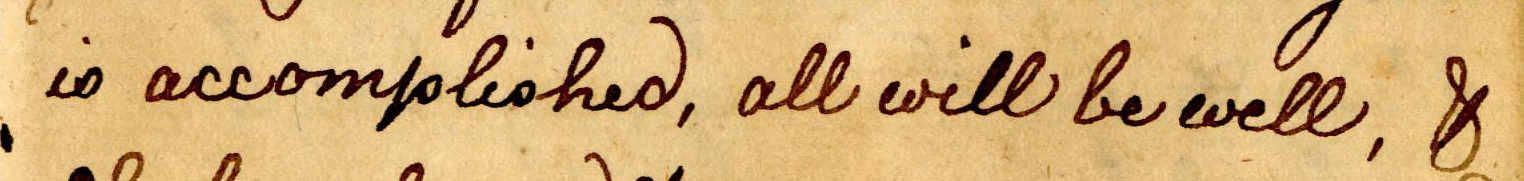is accomplished, all will be well, &
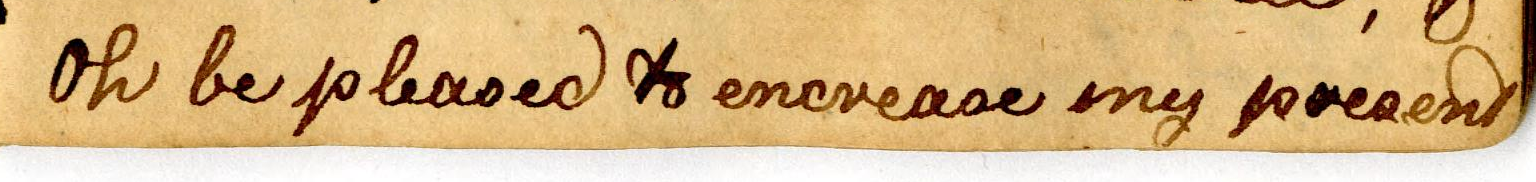Oh be pleased to encrease my present
